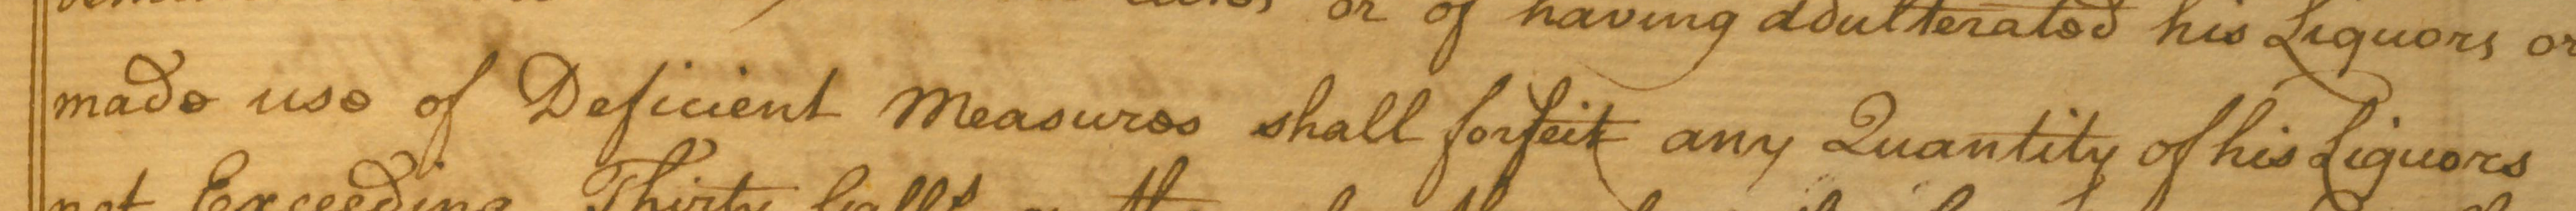made us of Deficient Measures shall forfeit any Quantity of his Liquors
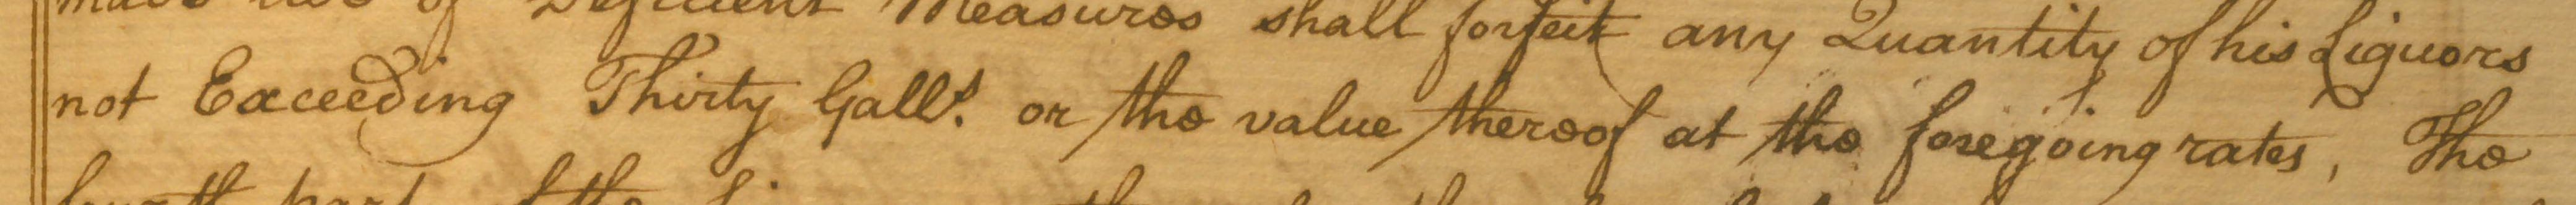not Exceeding Thirty Gall^s. or the value thereof at the foregoing rates. The
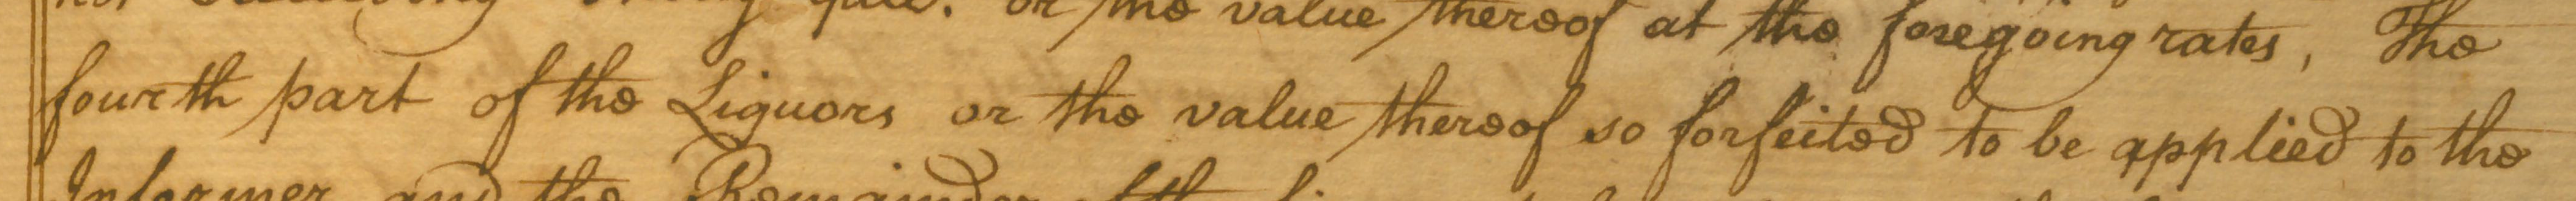fourth part of the Liquors or the value thereof so forfeited to be applied to the
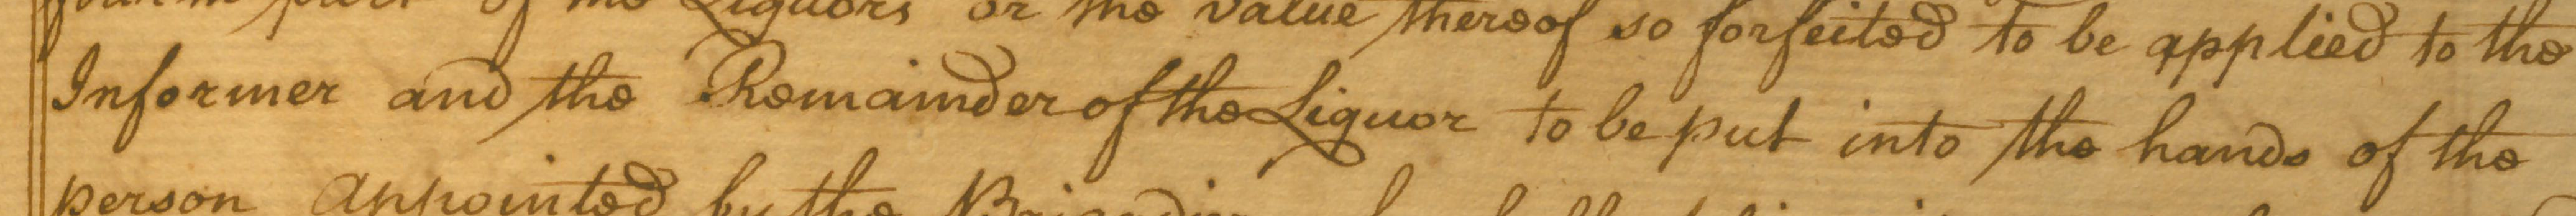Informer and the Remainder of the Liquor to be put into the hands of the
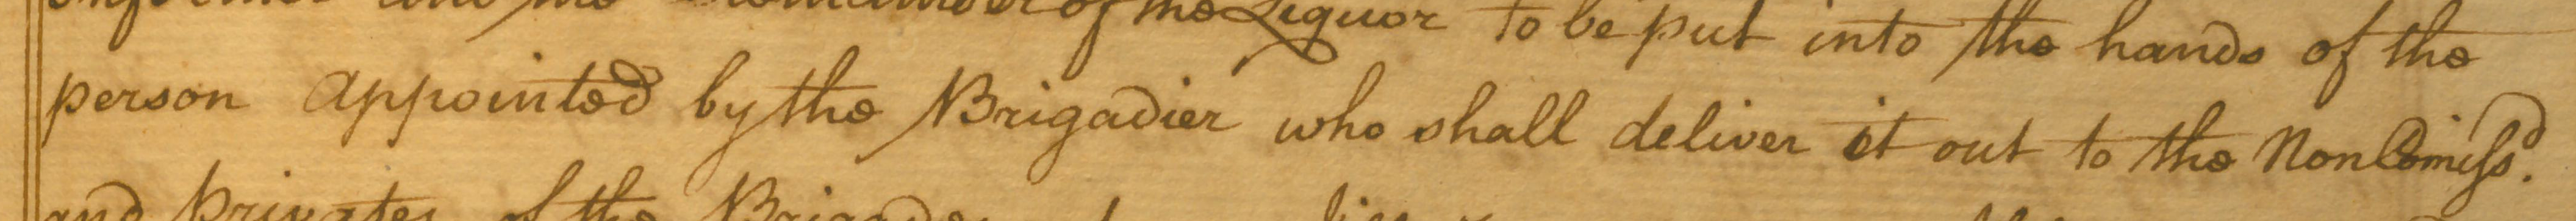person appointed by the Brigadier who shall deliver it out to the non Comiss^d.
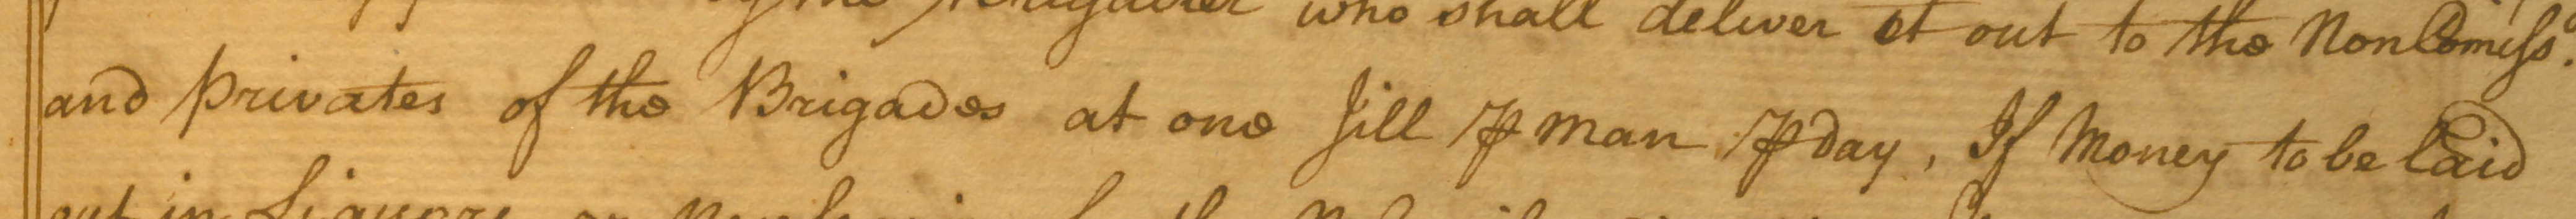and privates of the Brigades at one Jill per man per day. If money to be laid
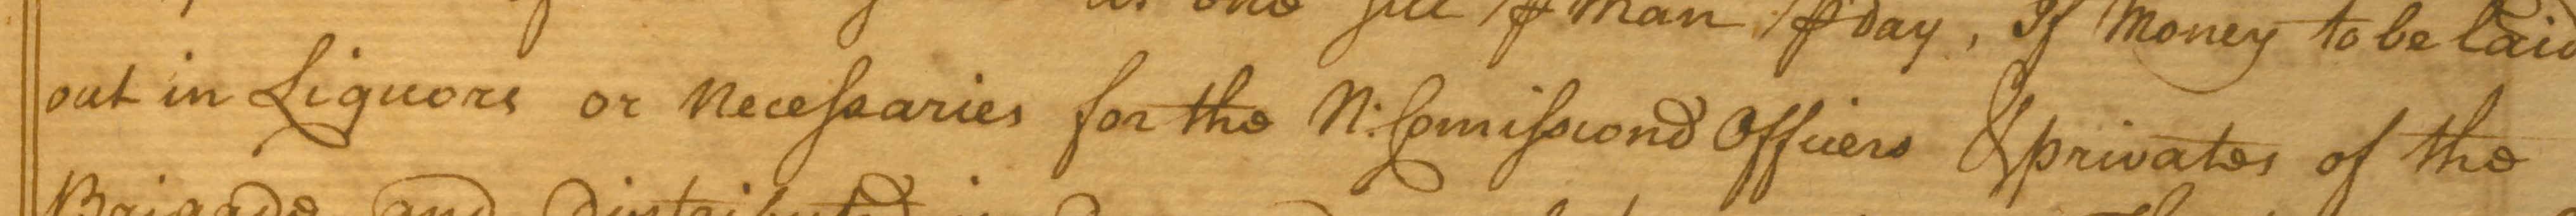out in Liquors or necessaries for the N: Comissiond Officers & privates of the
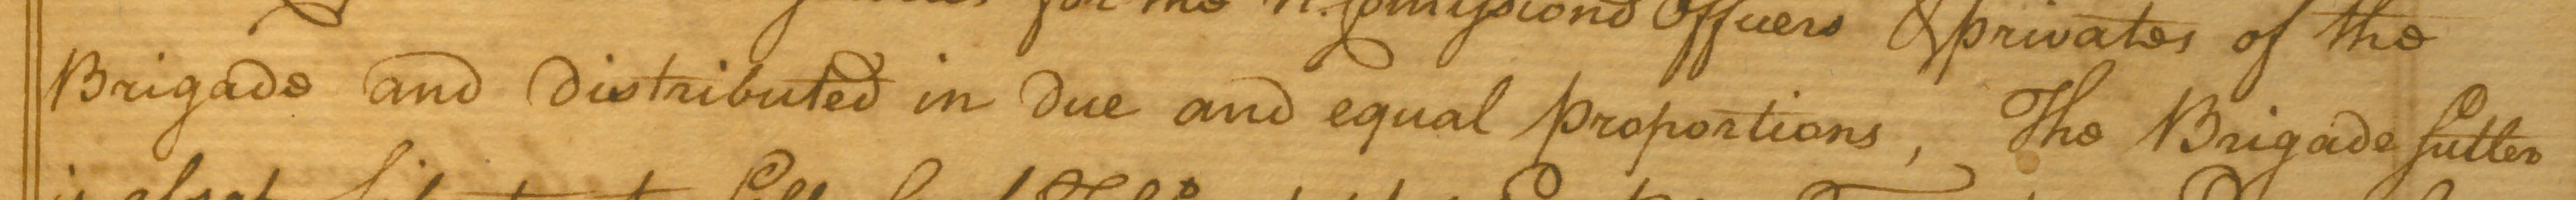Brigade and distributed in due and equal proportions, The Brigade sutler
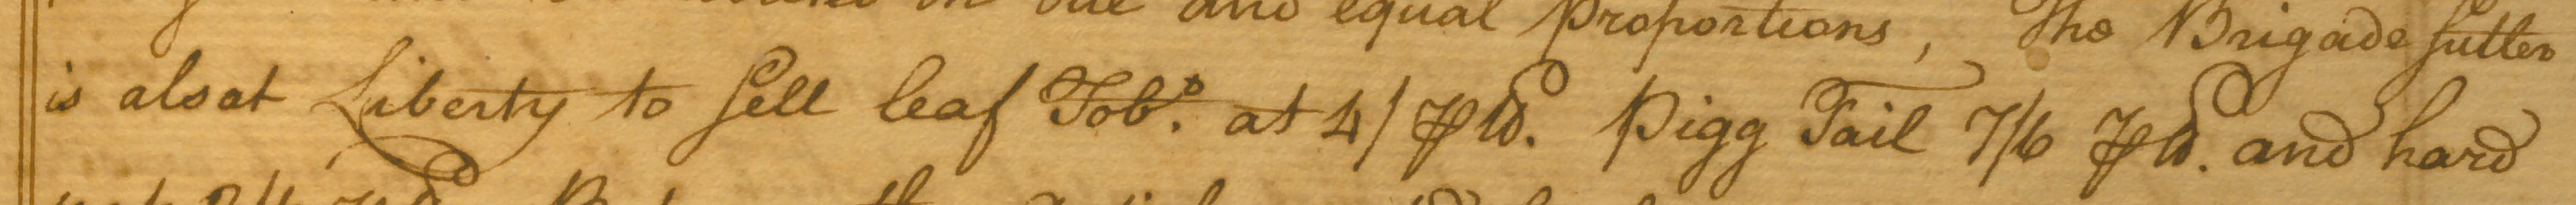is alsat Liberty to sell leaf Tob^o. at 4s per lb. Pigg Tail 7s6 per lb. and hard
